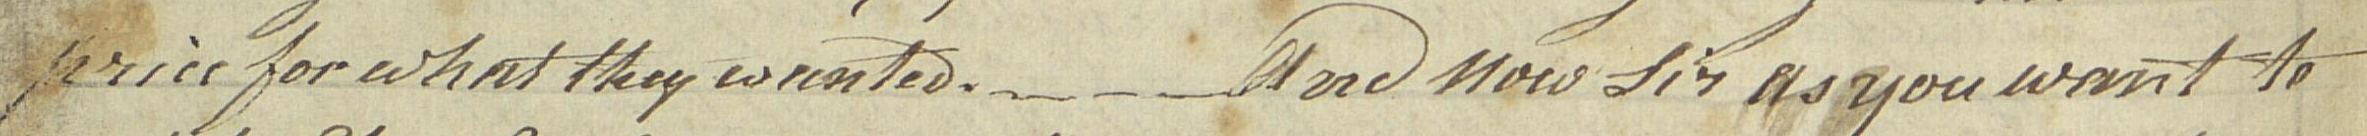price for what they wanted. And Now Sir as you want to
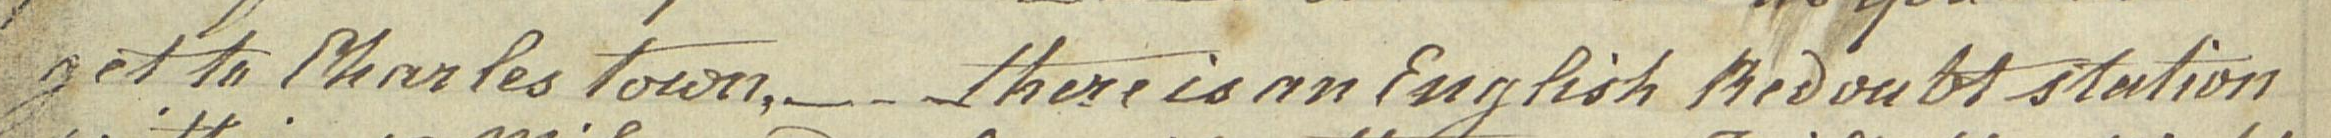get to Charles town, there is an English Redoubt station
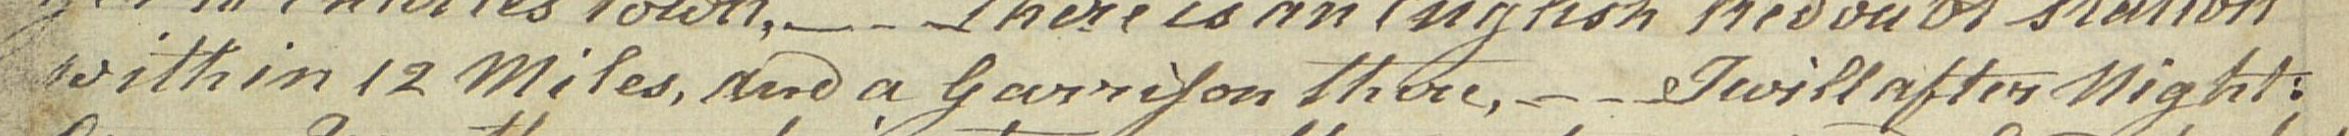within 12 Miles, and a Garrison there, I will after Night:
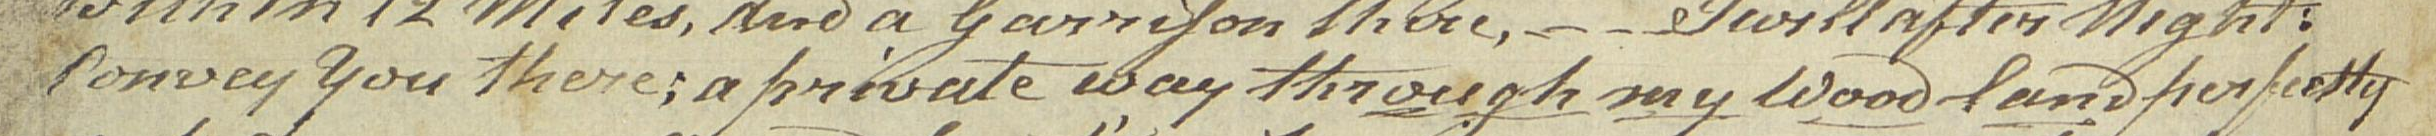convey you there; a private way through my Woodland perfectly
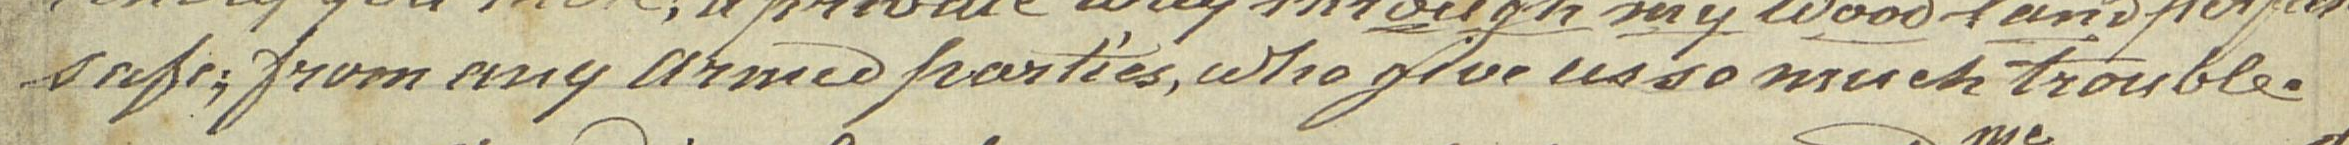safe; from any armed parties, who give us so much trouble
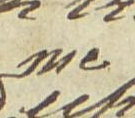me
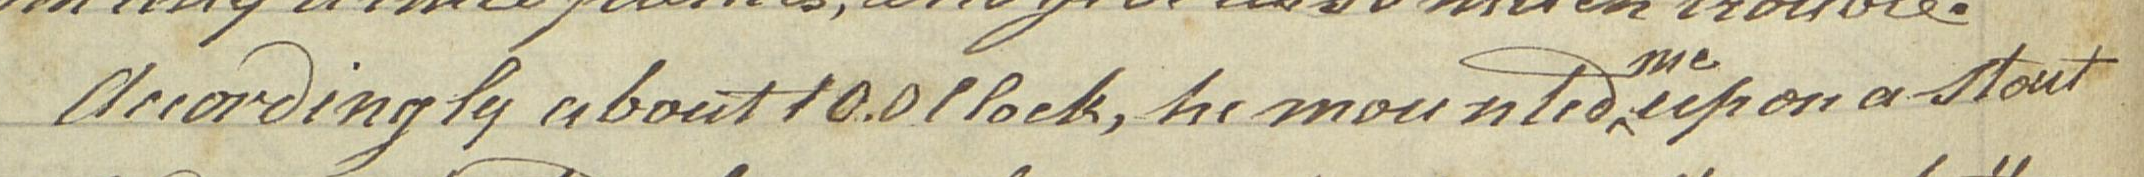Accordingly about 10 OClock, he mounted ^ upon a stout
